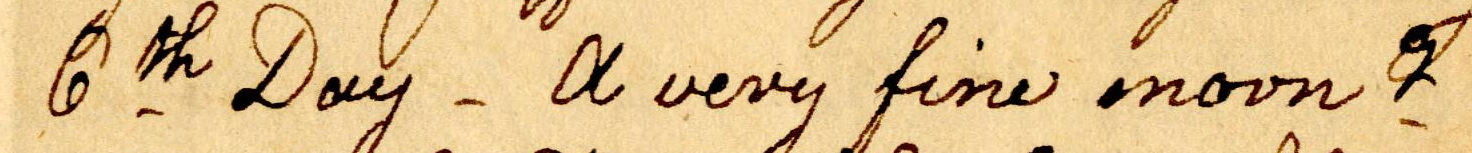6^th Day- A very fine morn^g
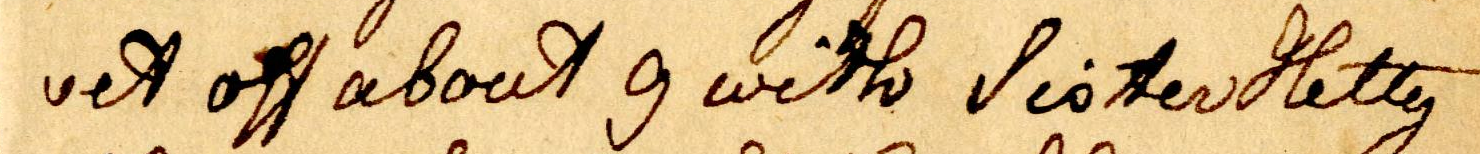set off about 9 with Sister Hetty
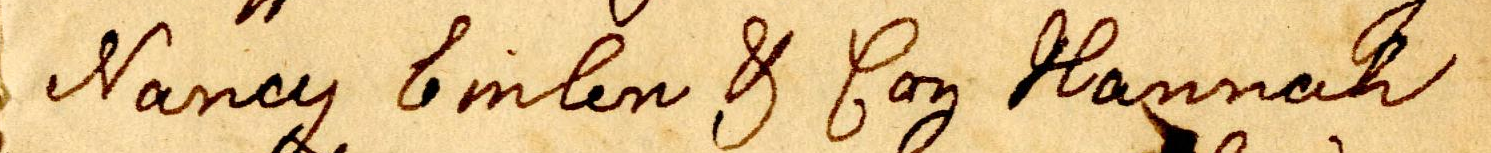Nancy Emlen & Coz Hannah
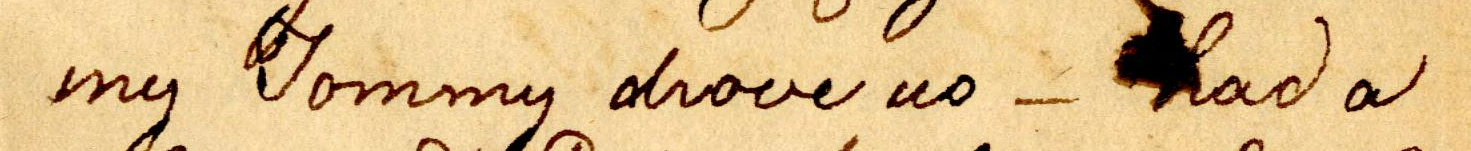my Tommy drove us- had a
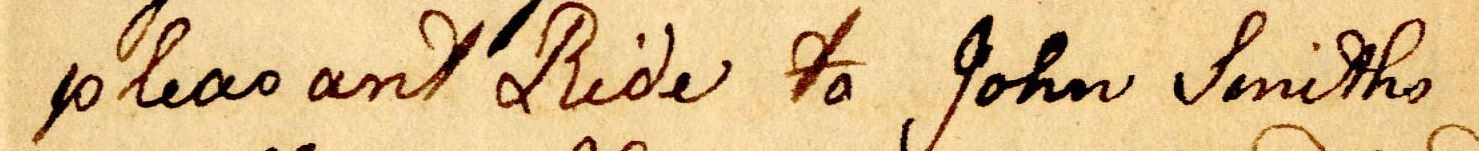pleasant Ride to John Smiths
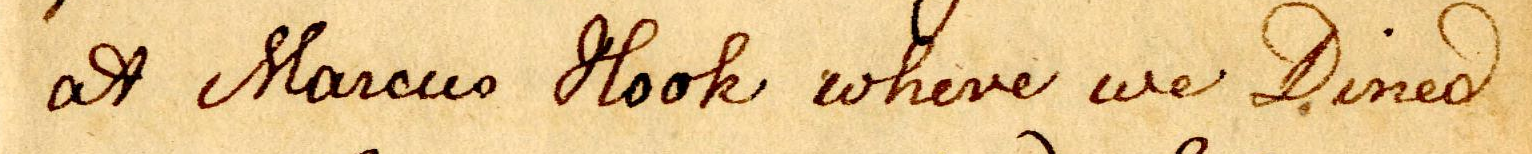at Marcus Hook where we Dined
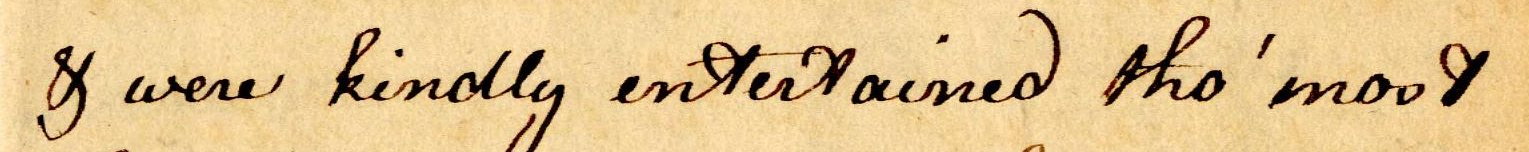& were kindly entertained tho' most
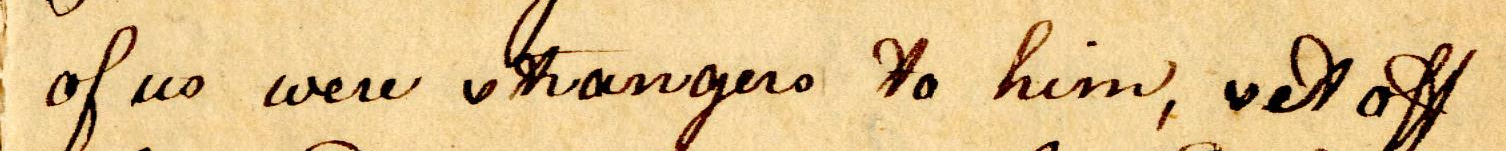of us were strangers to him, set off
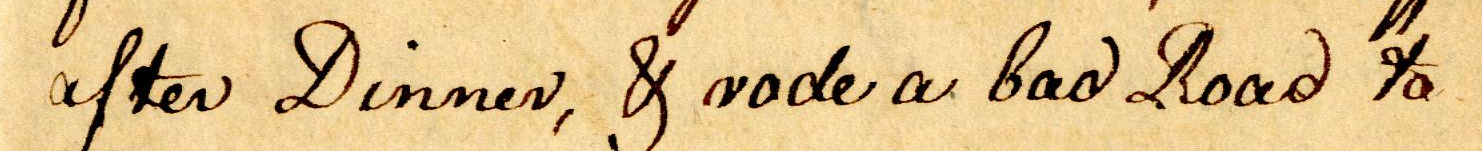after Dinner, & rode a bad Road to
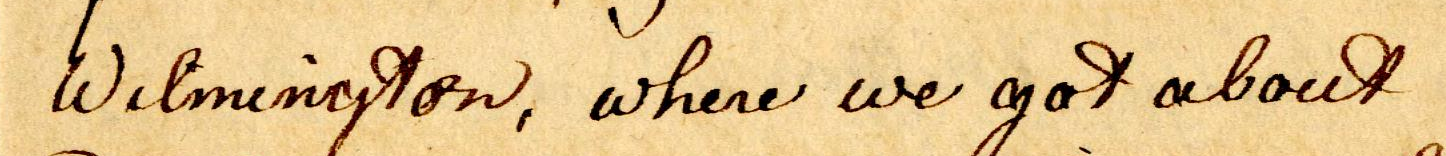Wilmington, where we got about
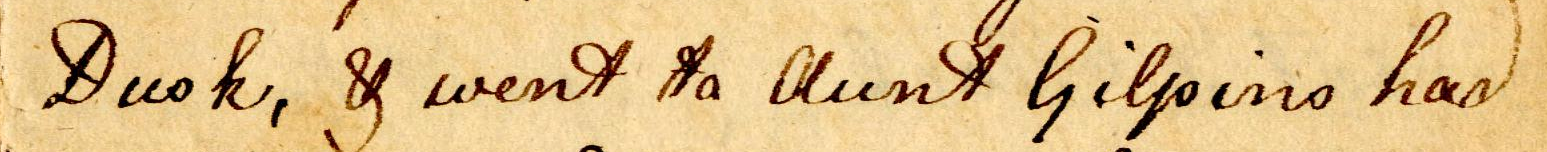Dusk, & went to Aunt Gilpins had
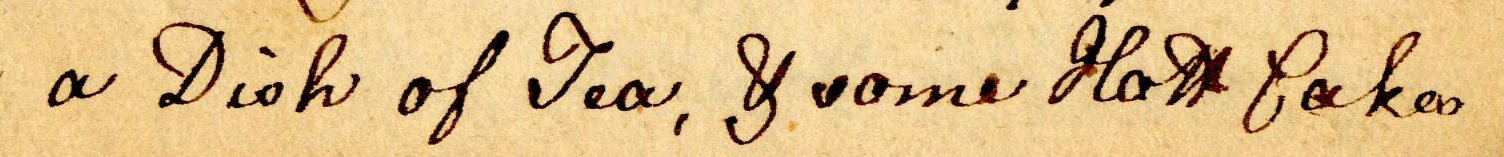a Dish of Tea, & some Hott Cakes
